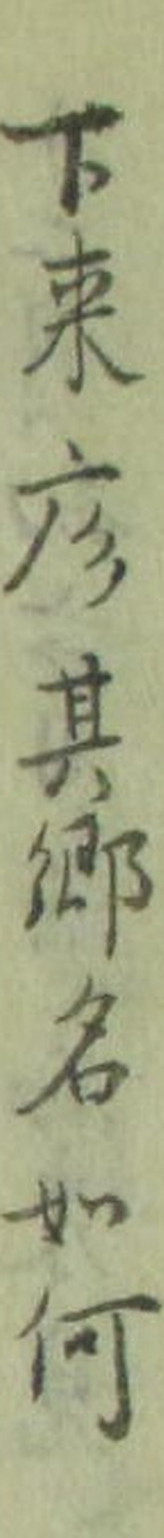下来其郷名如何鳴
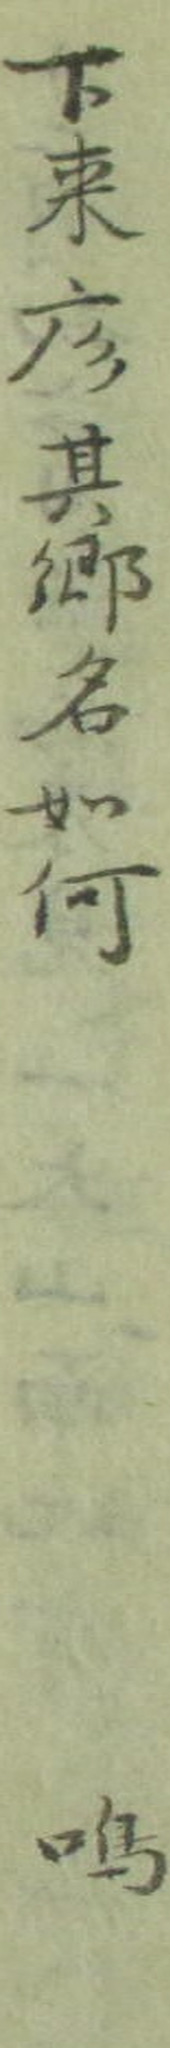下来其郷名如何鳴
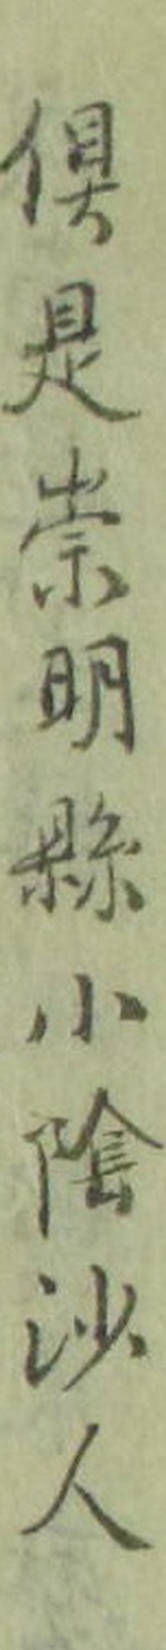倶是崇明県小陰沙人王
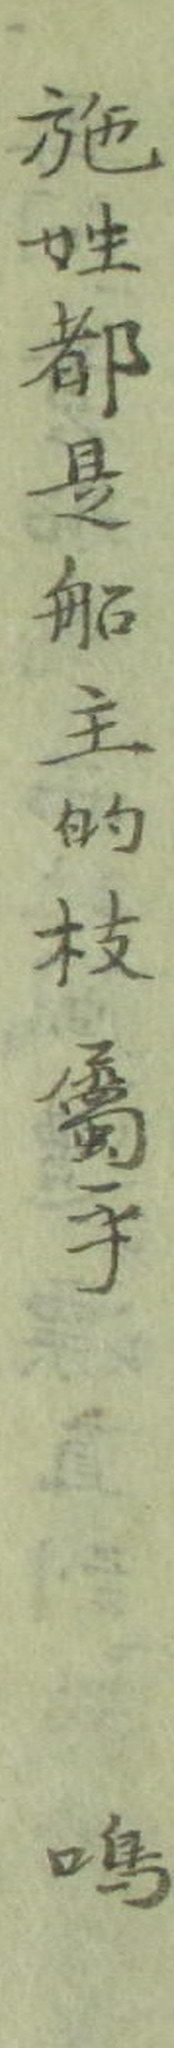施姓都是船主的枝属乎鳴
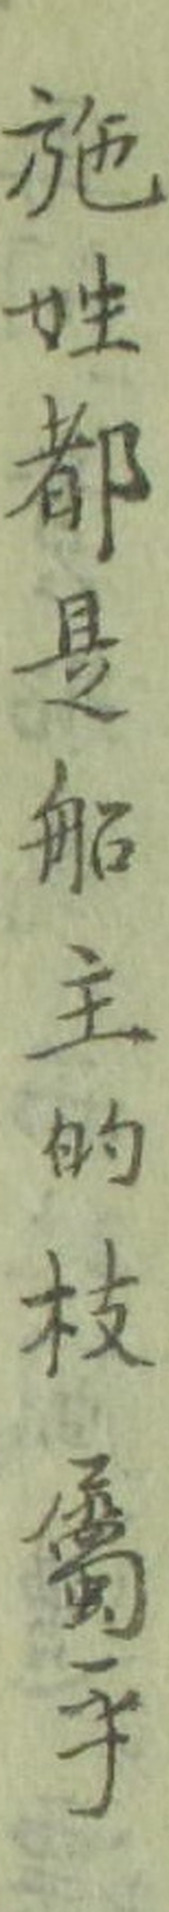施姓都是船主的枝属乎鳴
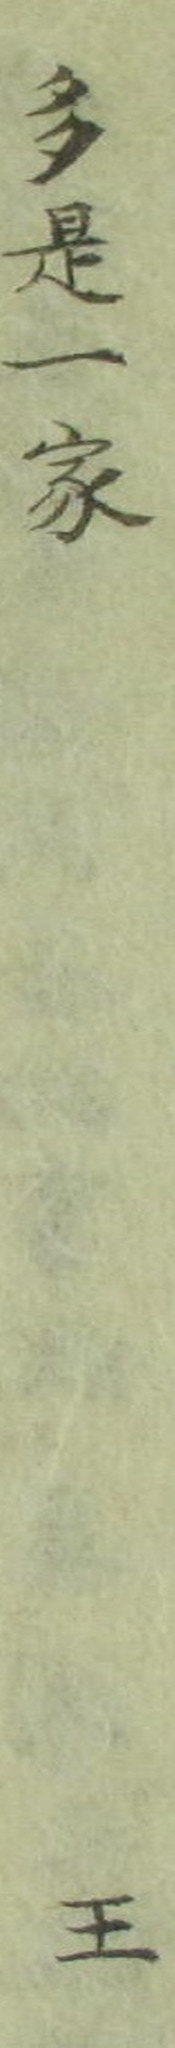多是一家王
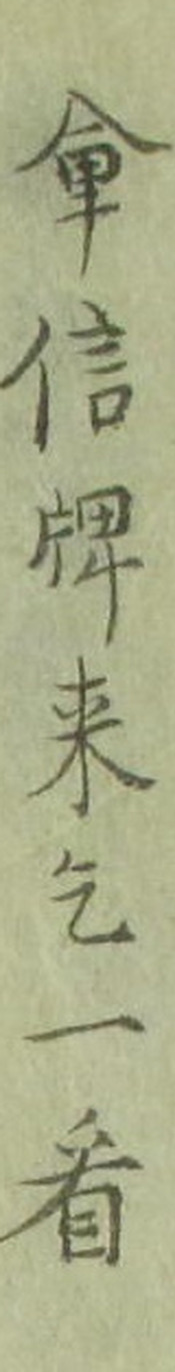信牌来乞一看鳴
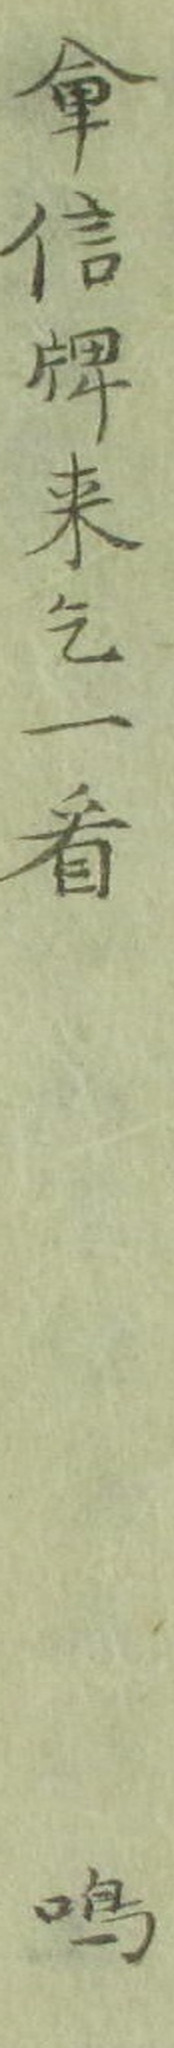信牌来乞一看鳴
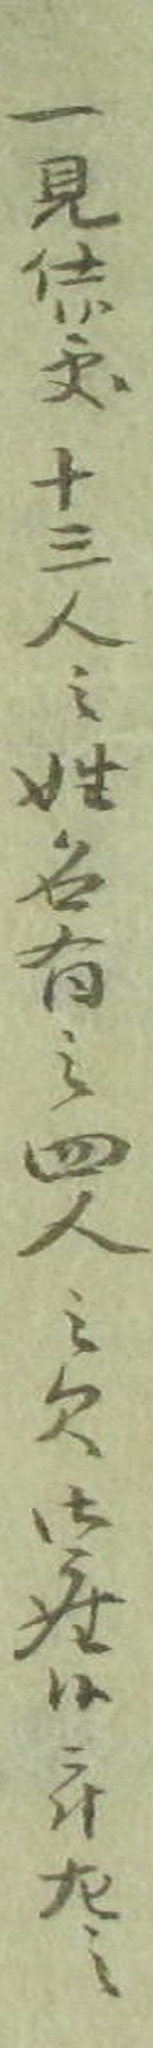一見仕候更十三人之姓名有之四人之欠御座候ニ付左之
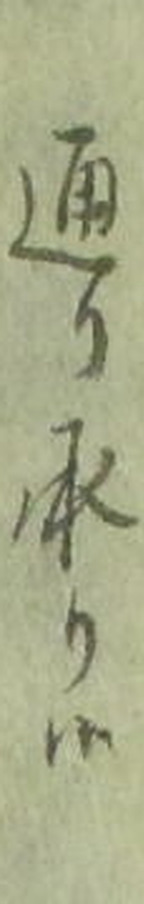通り承り候
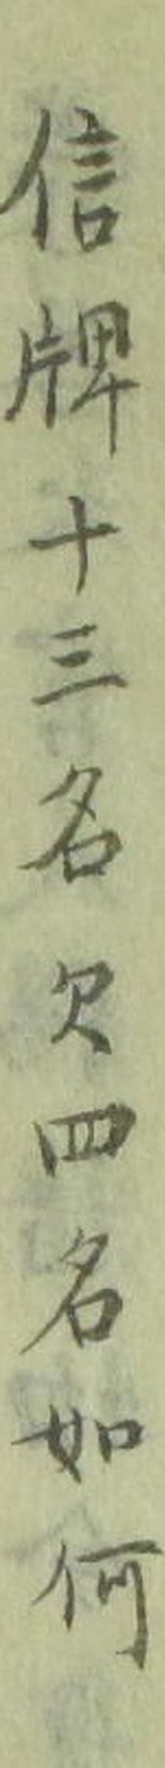信牌十三名欠四名如何王
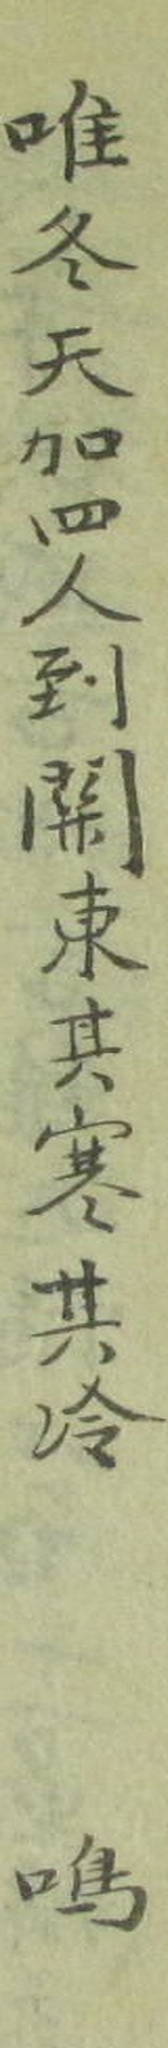唯冬天加四人到関東其寒其冷鳴
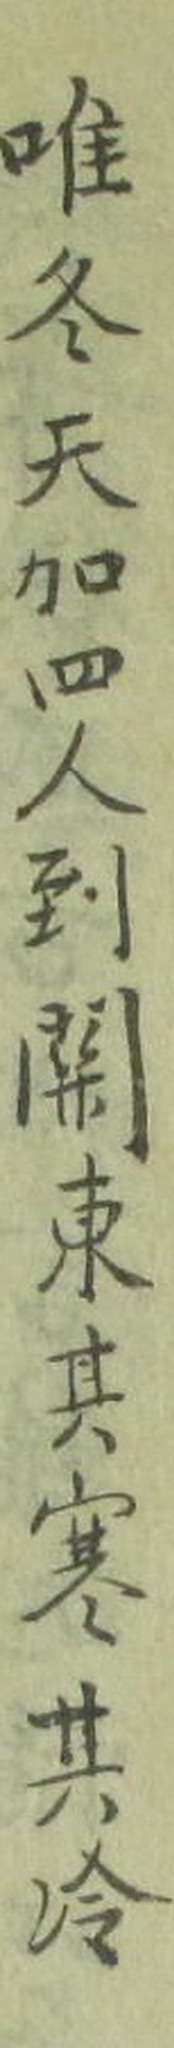唯冬天加四人到関東其寒其冷鳴
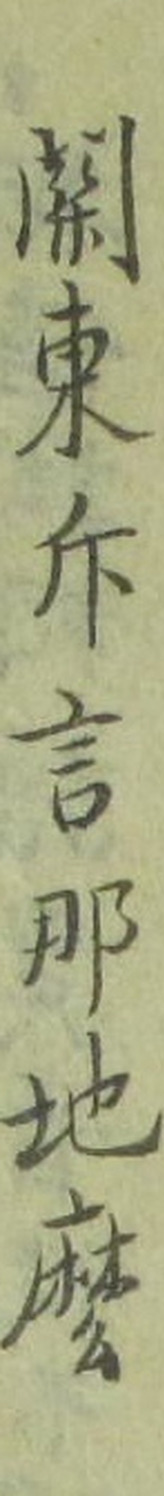関東斥言那地麼
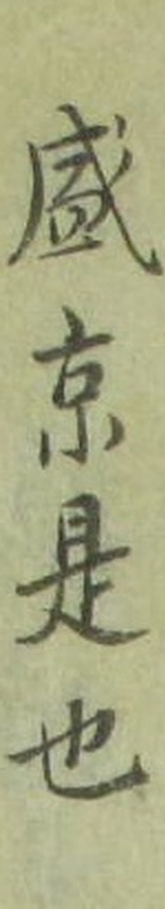盛京是也
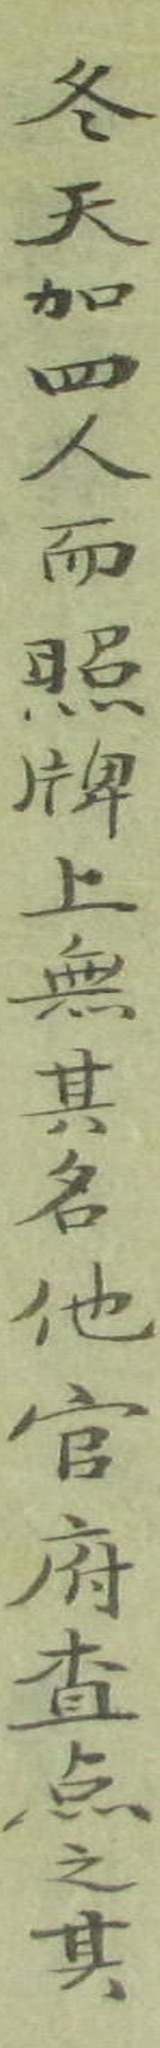冬天加四人而照牌上無其名他官府査点之其
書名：紀州九木浦庄屋記録 四
